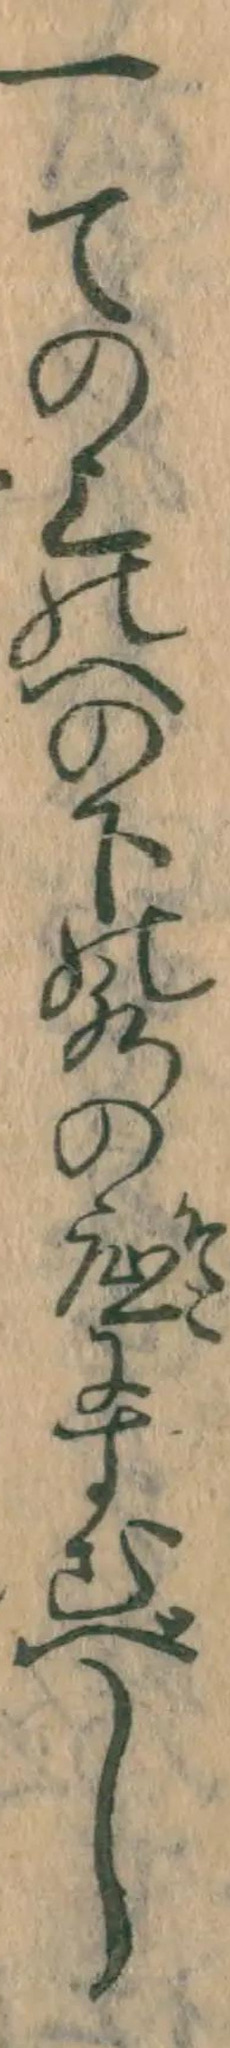一ての上のへの下の水の底にすむべし
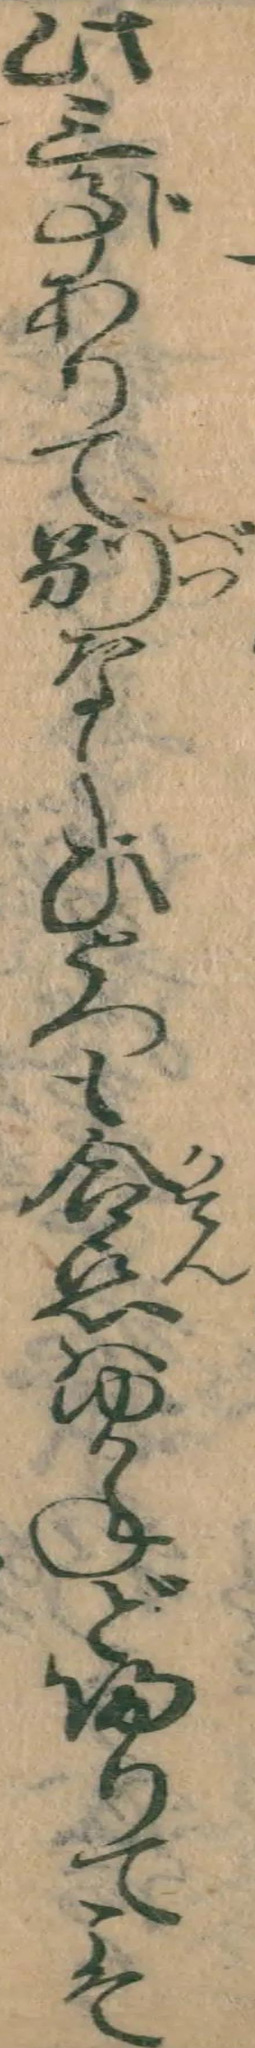此三事ありて別なしひとつも合点はゆかねど帰りてこそ
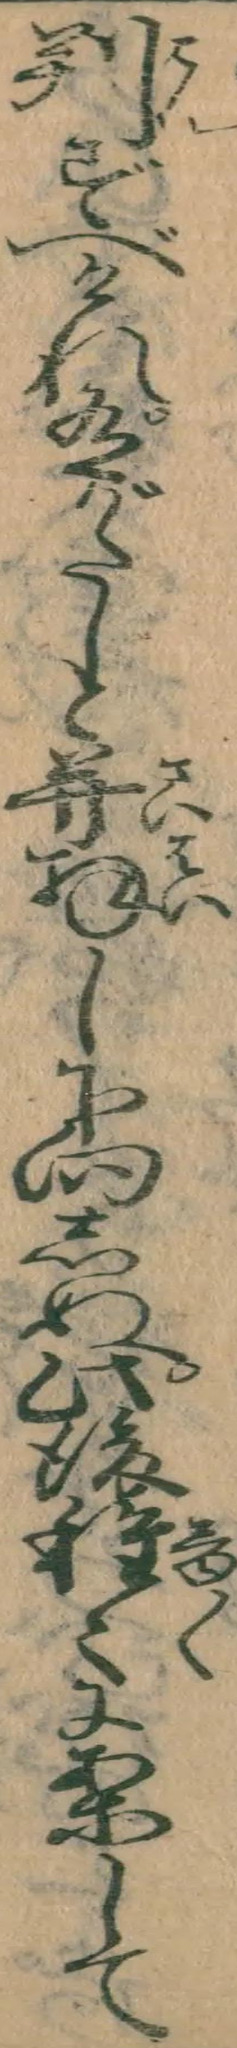判ずべけれ。有がたしと再拝し下向しぬ。此後種々に案して
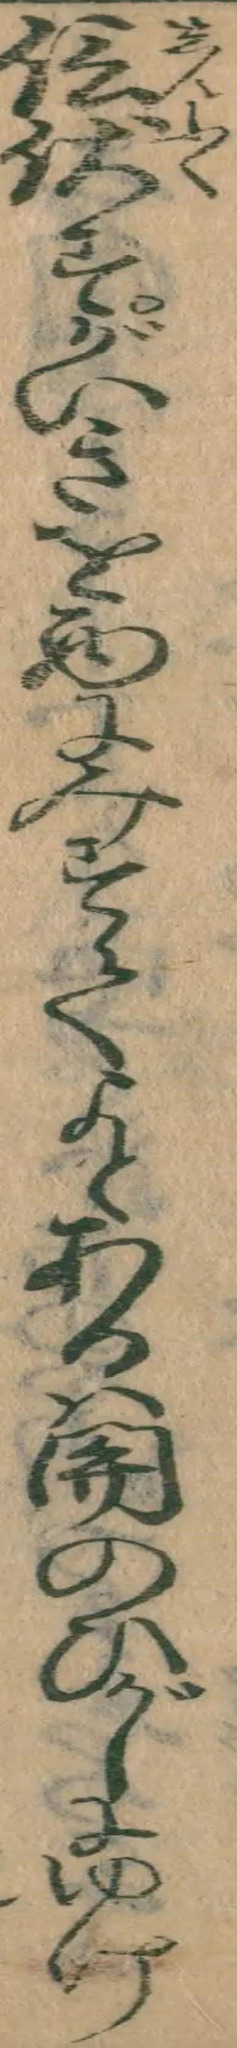信伏す。がいきを西にみすてよとあるは関のひがしにゆけ
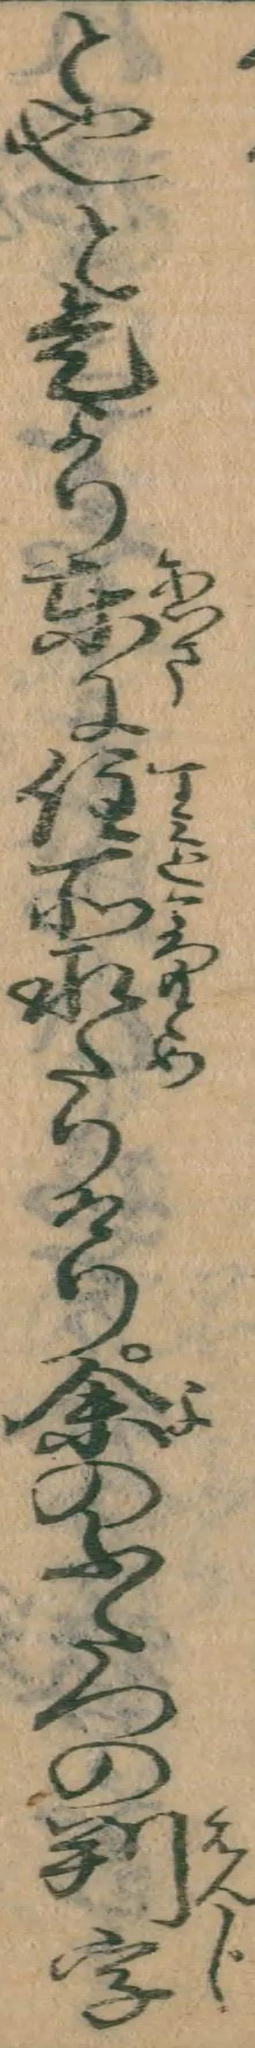と也と是より東に住所求たりけり。余のふたつの判字
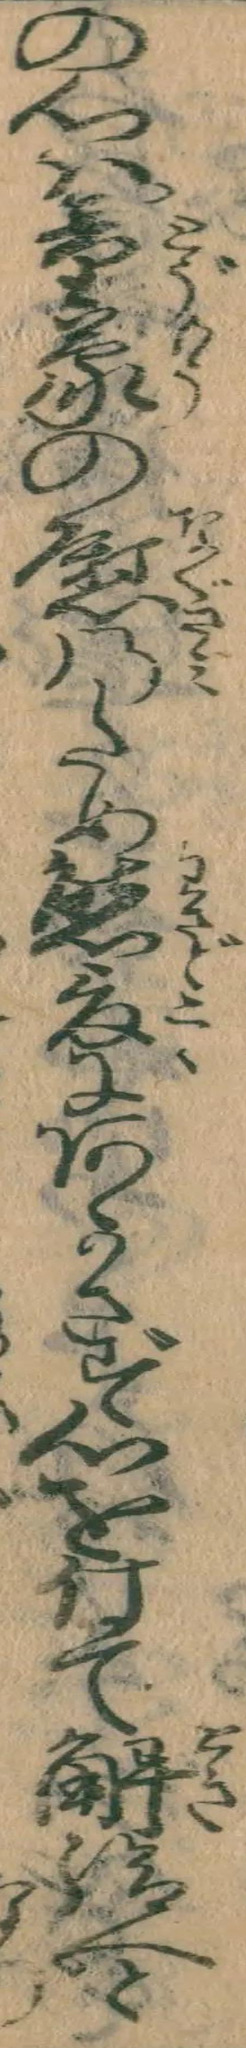の心は。童蒙の慰のため熊爰にあかさず心を付て解給へとなり
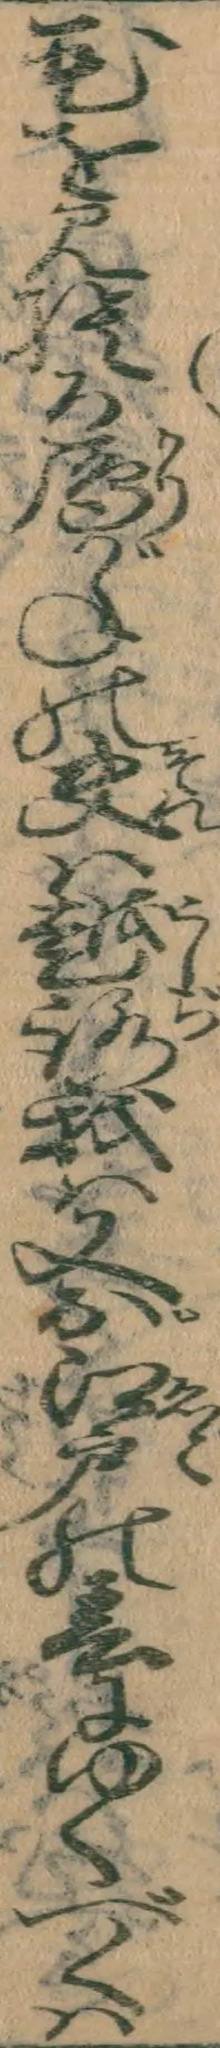花を見捨る雁がねの夫は越路我は又。お江戸の春にゆくべくは
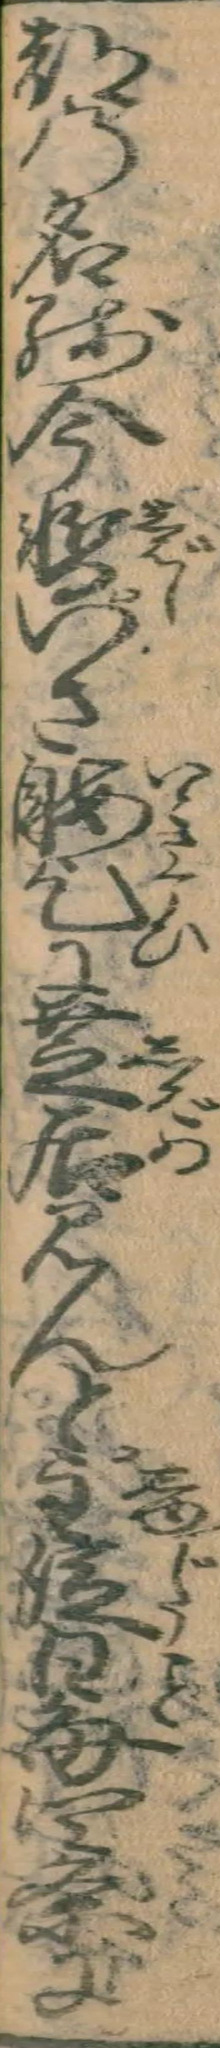都の名残今暫。いさ暇乞に芝居見んと。主従日毎四条に
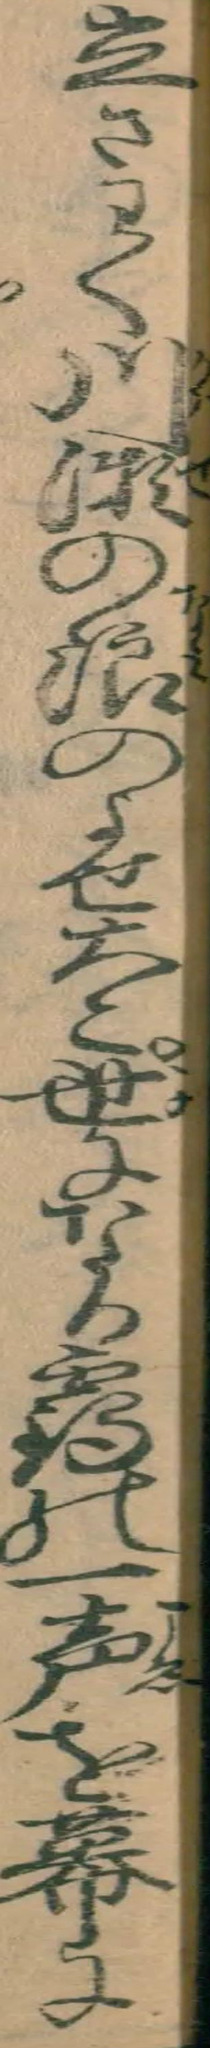立さわく川瀬の浪のよせ大こ。世になる鶴の一声を幕に
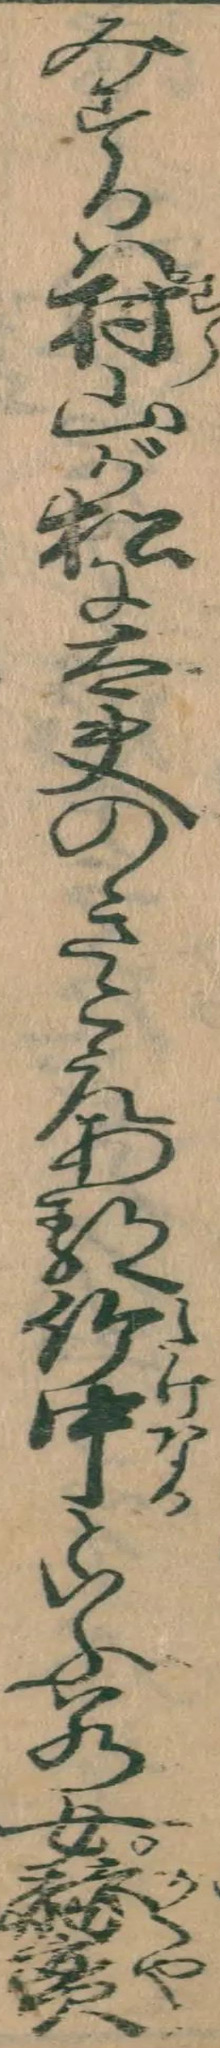みするは。村山が松に太夫のきこえある竹中といふ若女。赫
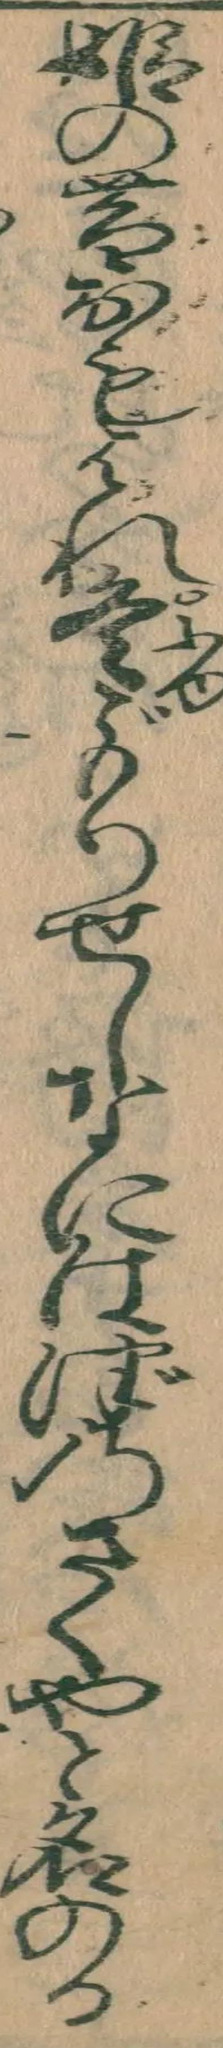姫の昔おもはれ。冬ごもりせしなにはづのさくやと名のる
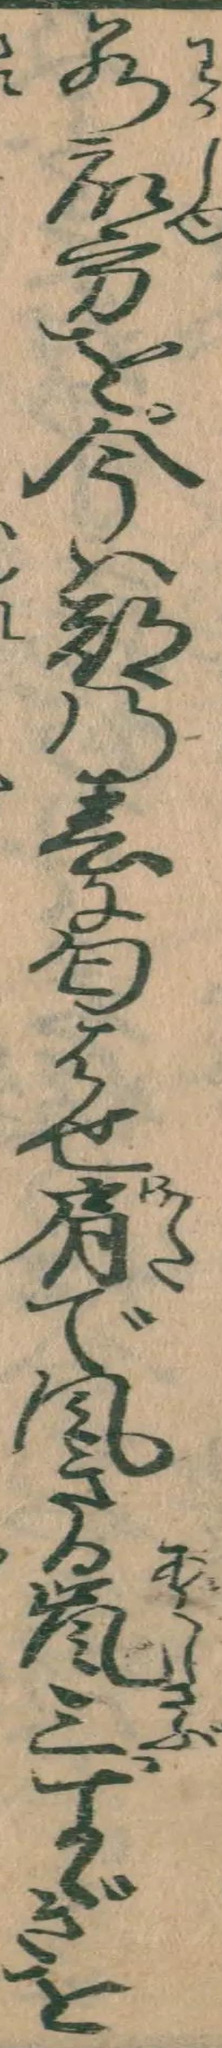若衆方を。今は都の春に匂はせ肩で風きる嵐三。すゞきを
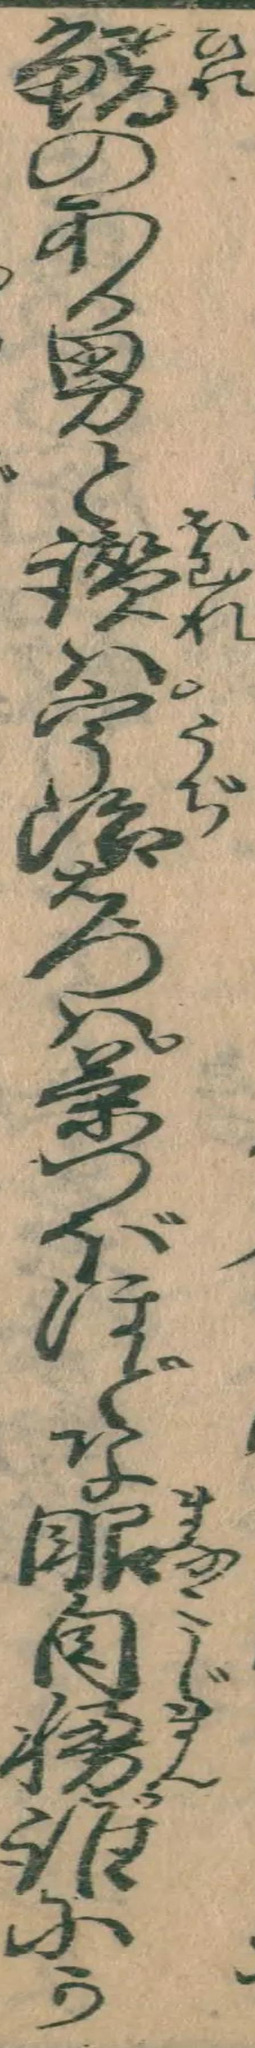鰭のある男と讃は。宇治右衛門は。茶つぼほどな眼自慢。誰にか
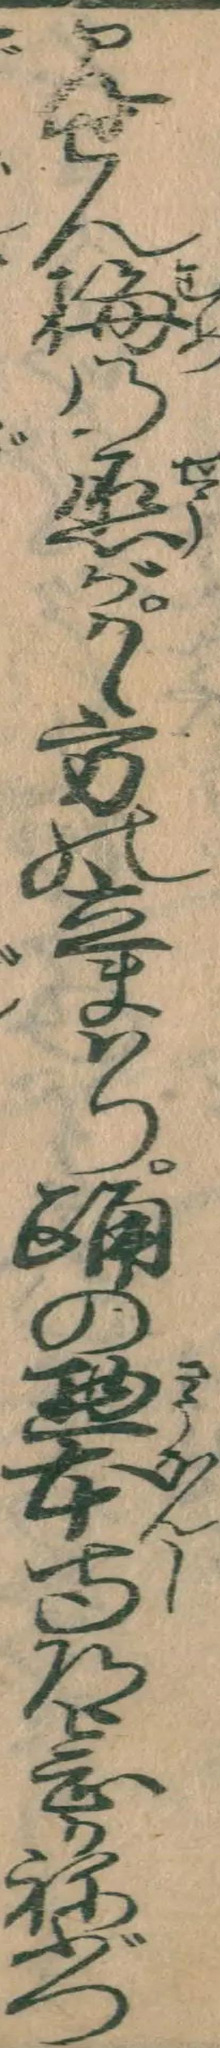見せん梅の丞が。かゝ方の立まはり。踊の惣本寺道念かねぶつ
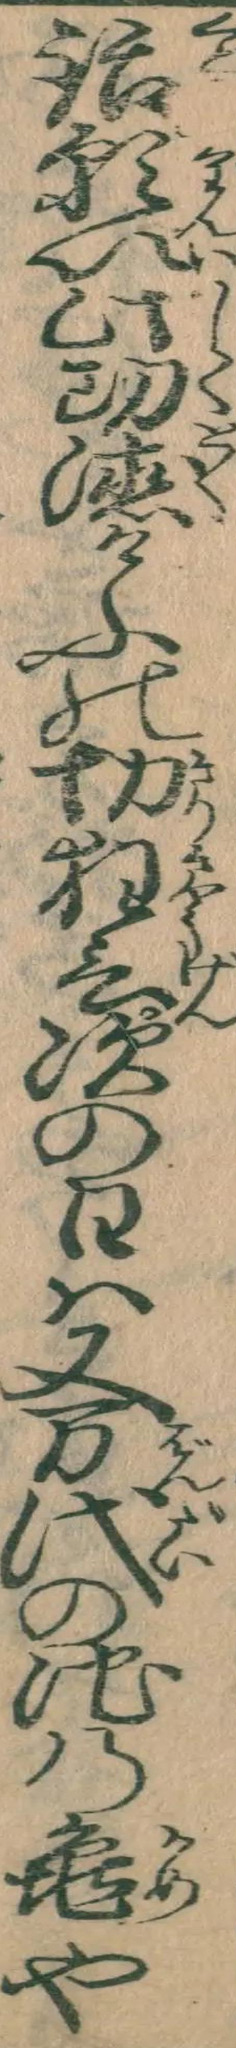話願以此功徳けふの切狂言。次の日は又万代の池の亀や
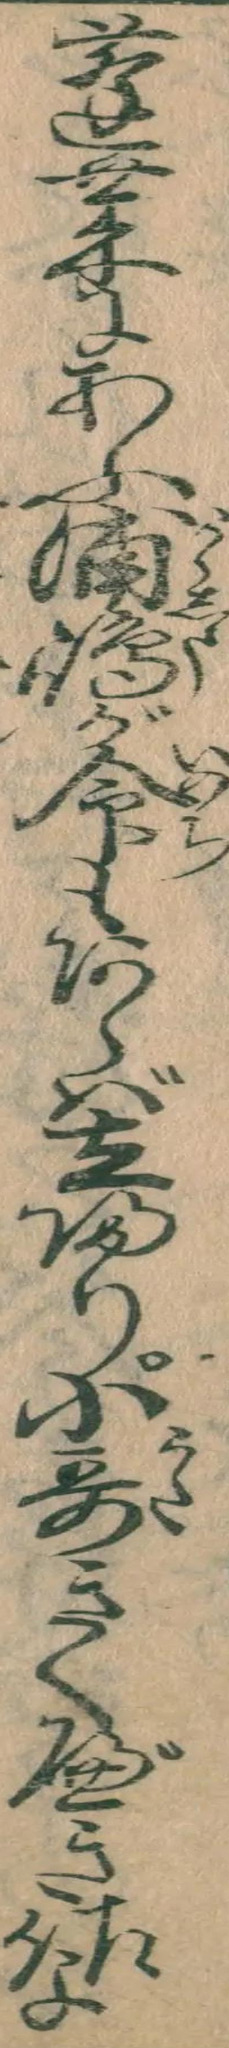蓬莱にあふ浦島が命もあらば立帰り。小歌きくべき佐よ
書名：新竹斎 5巻
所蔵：国立国会図書館 National Diet Library, JAPAN
